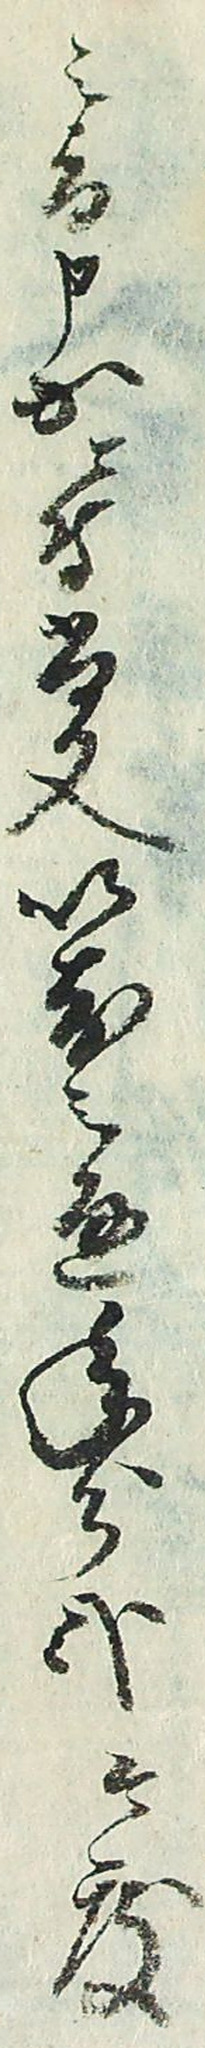の旨申出に付尚又以前の通年分二ヶ度
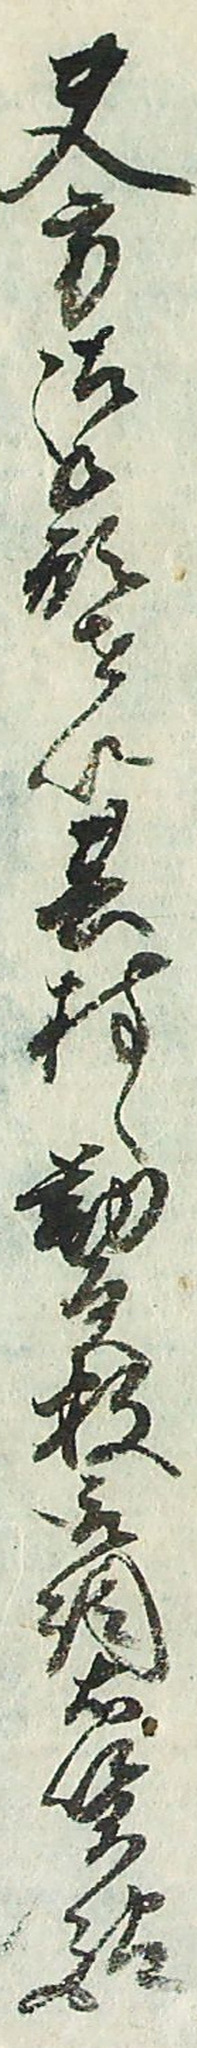夫方御手形を以其村へ勤員数取調右賃銀
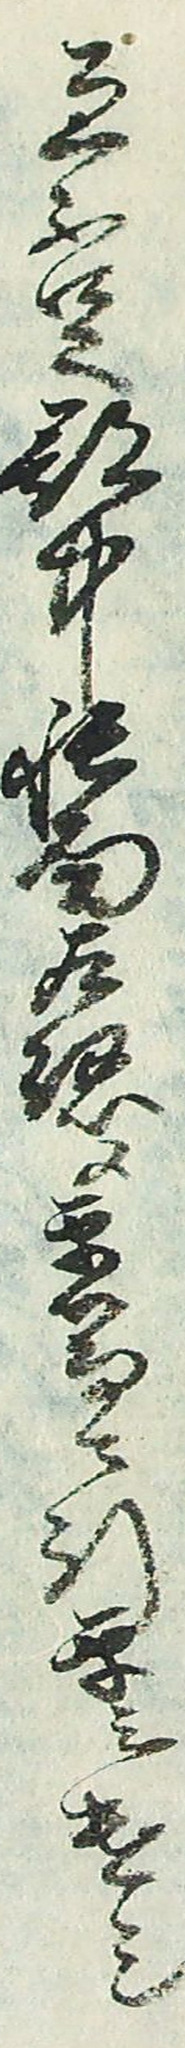過不足郡中帳面相認め平等に引平し遣し
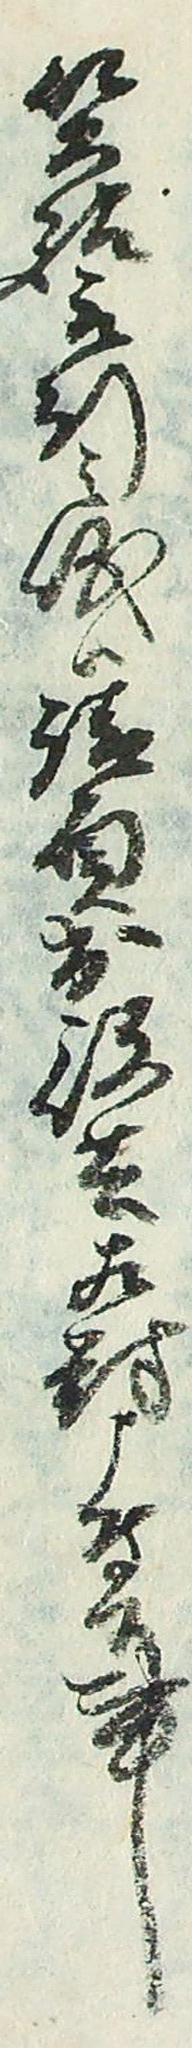賃銀取引の儀は請負出役共相対申付候事

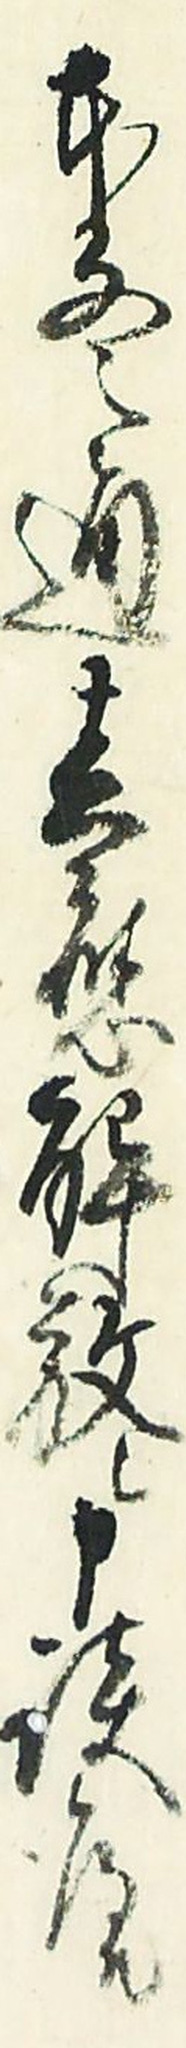本文の通春慰解放し申談候得共
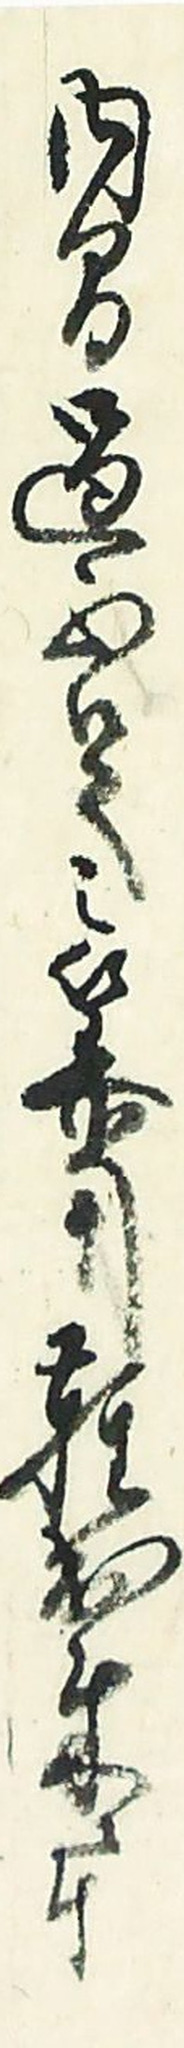内間過不足の算用軽出来に付
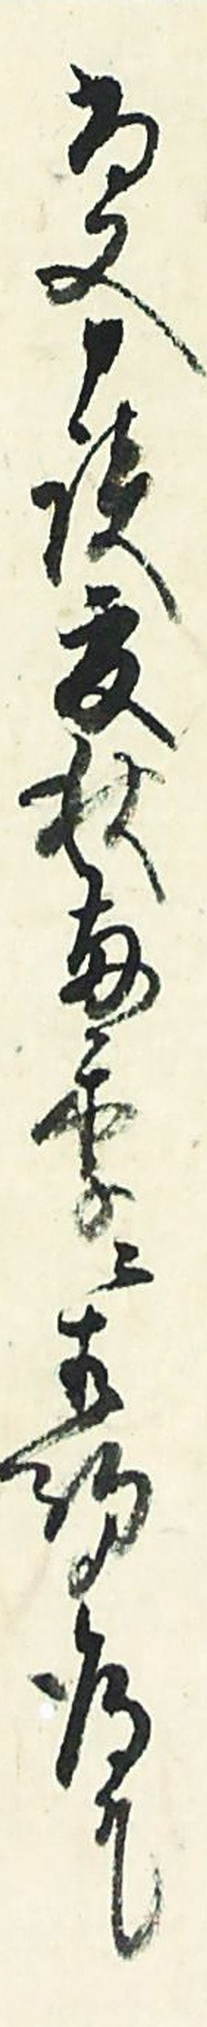尚又申談夏秋両季に相約め候得共
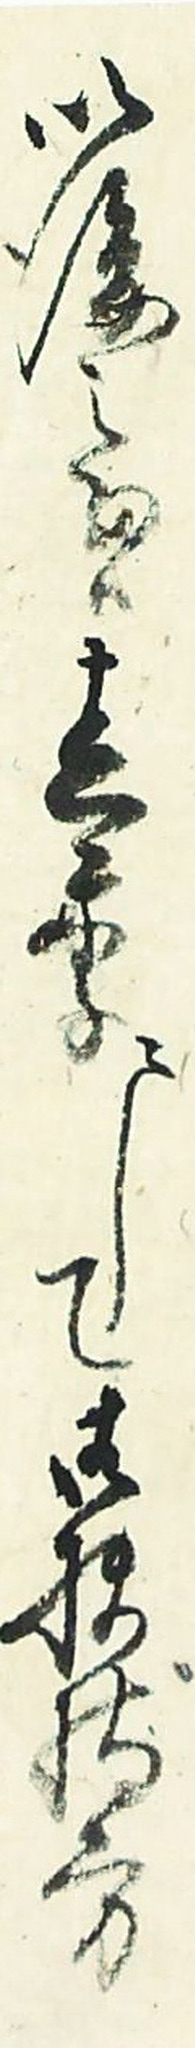以後の義は春季にして御扶持方
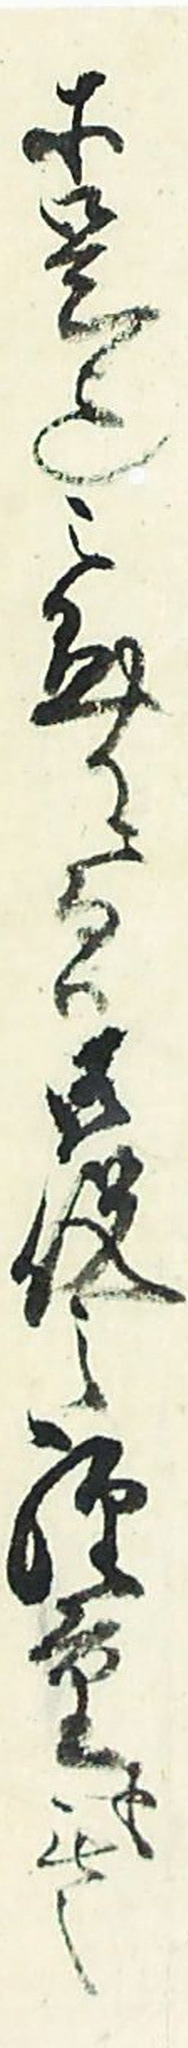等是迄の懸りにては御役の軽重も無之
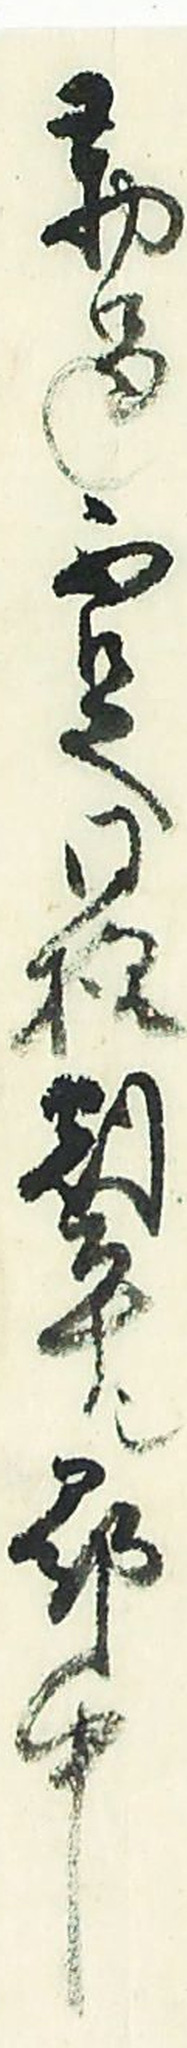勤過不足同様割平し郡中
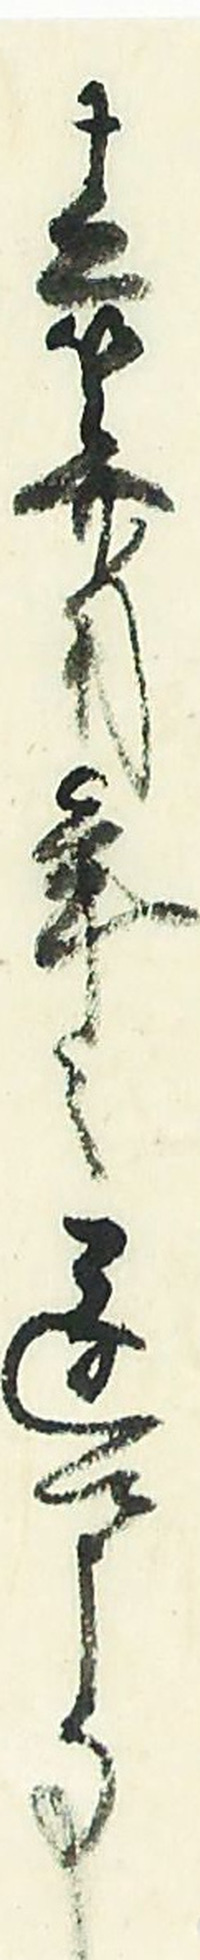春算用年之通可申事

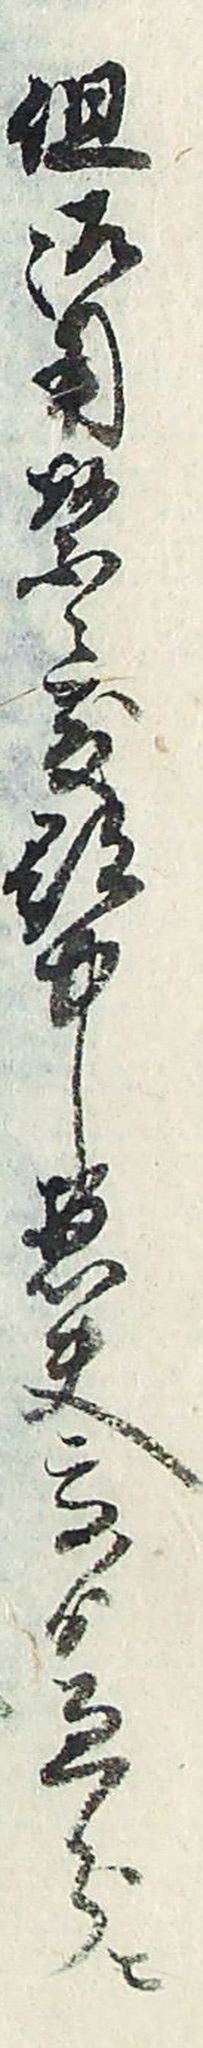但御用繁之度郡中惣夫高より過分に
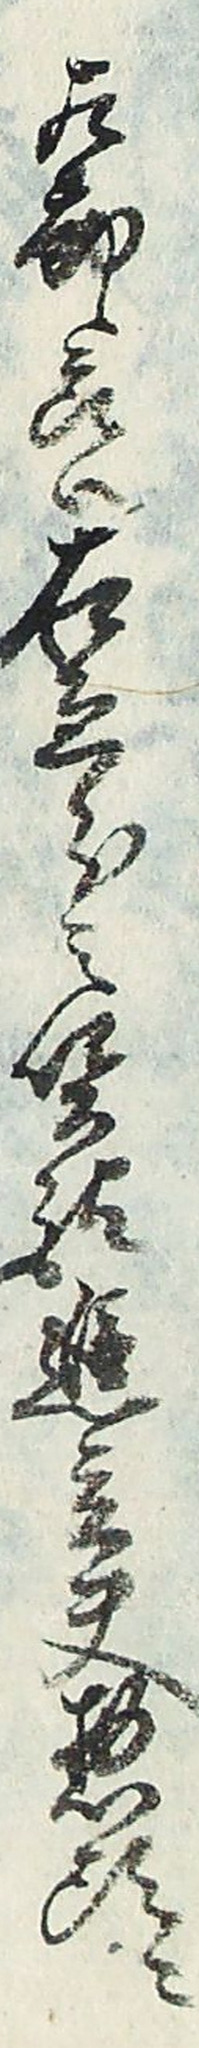相勤候節は右過分の賃銀追立夫惣頭に
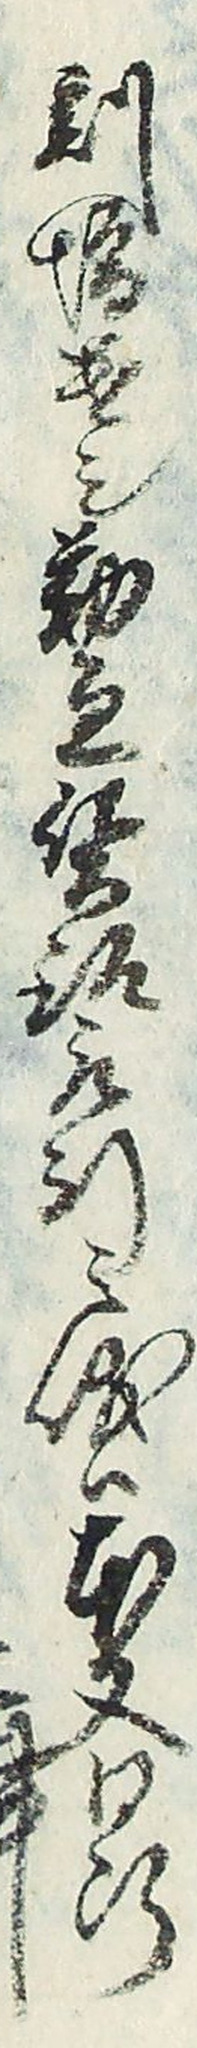割増遣し勤過賃銀取引の儀は本文同断の事
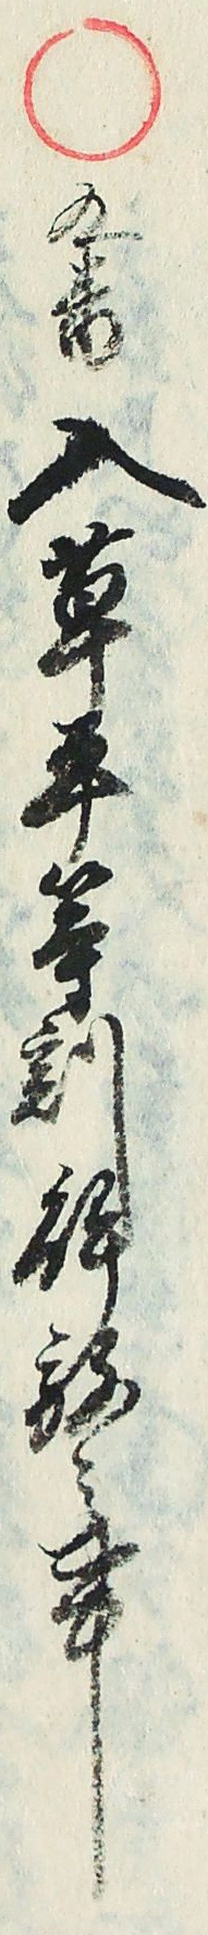九番入草平等割解放之事
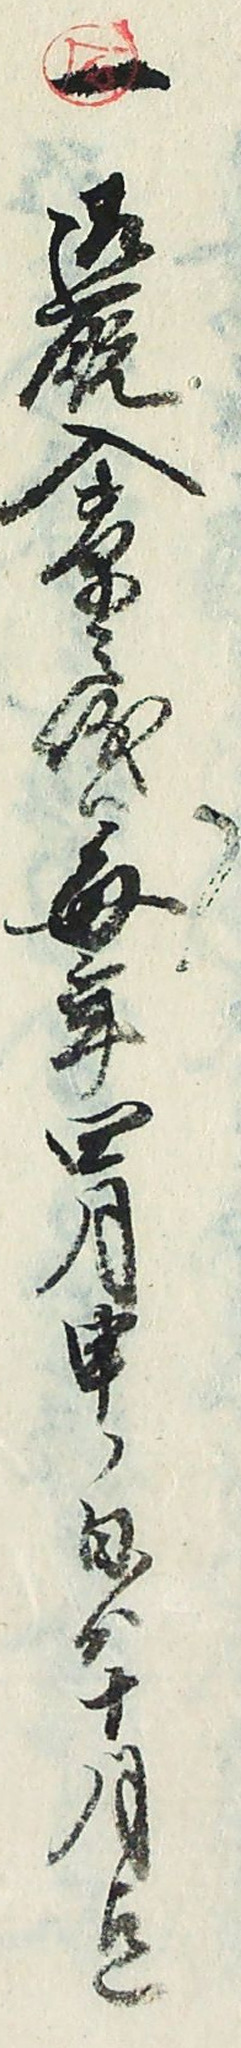一御厩入草の儀は毎年四月申の日より十月迄
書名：諸割賦物賃銀定記録帳
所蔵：鳴門教育大学 Naruto University of Education
